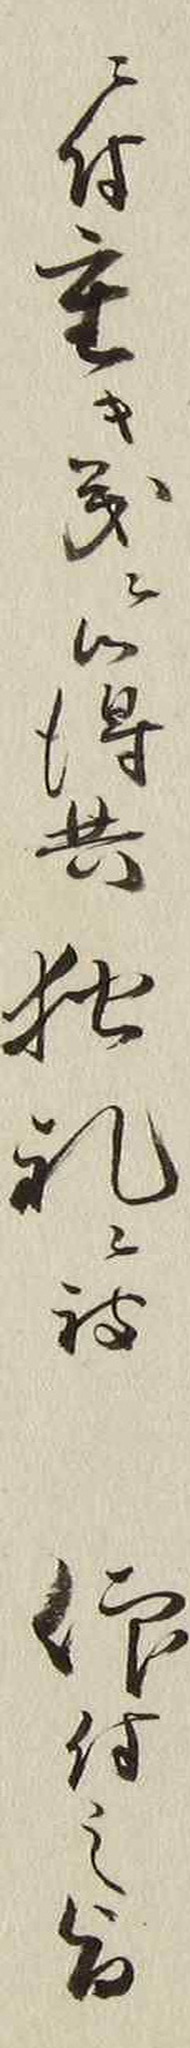ニ付重キ義ニ候得共独礼ニ被仰付之旨
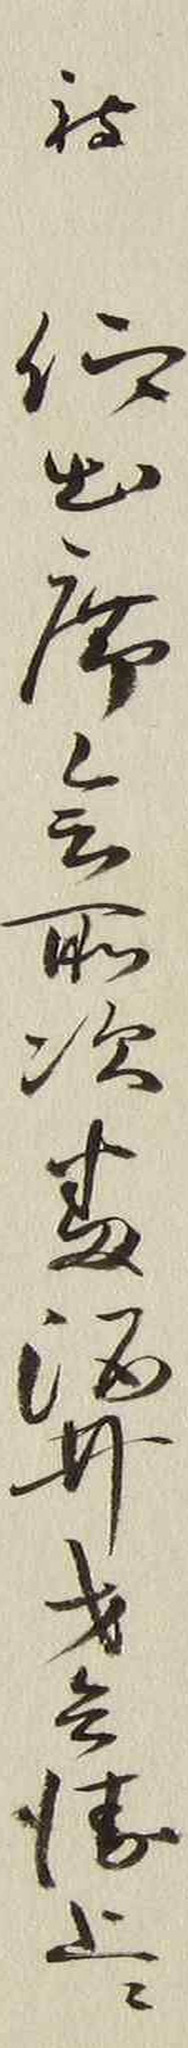被仰出席ニ而取次番酒井才兵衛上ニ
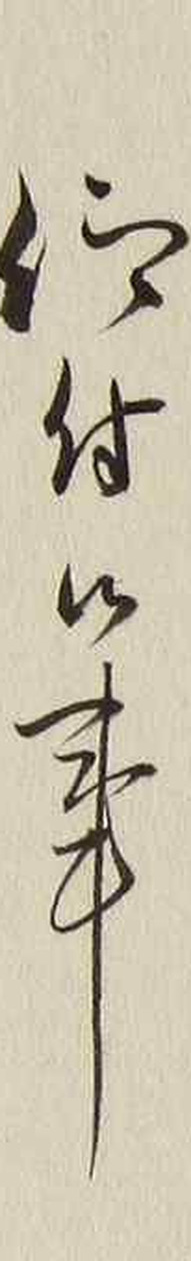被仰付候事
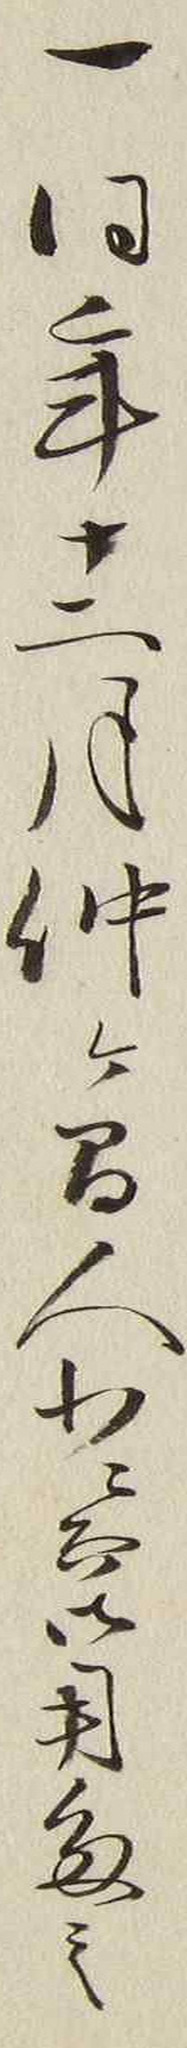一同年十二月仲ヶ間人少ニ而御用多之
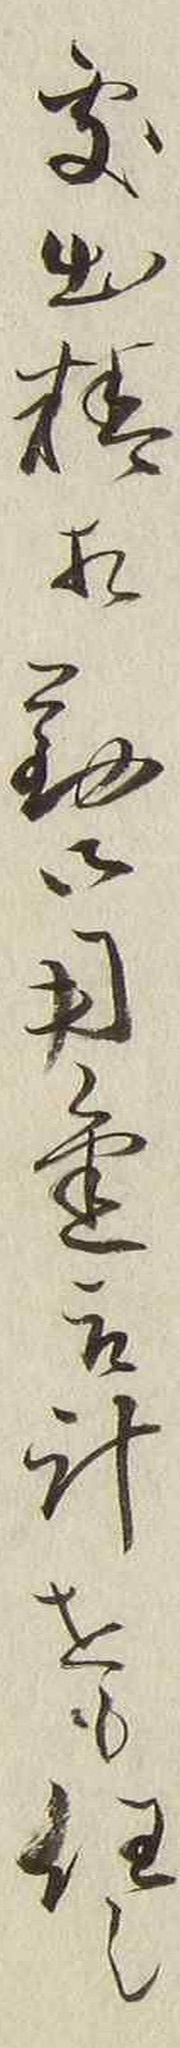処出精相勤御用金取計をも任し

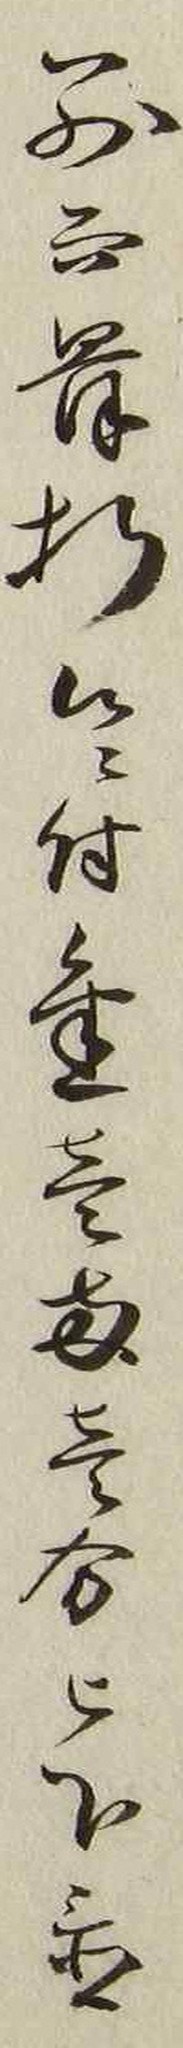別而骨折候ニ付金壱両壱分被下置
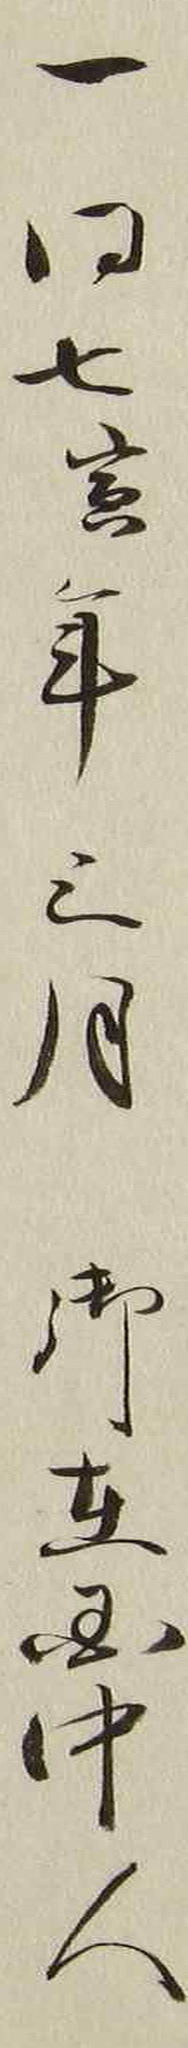一同七寅年三月御在国中人
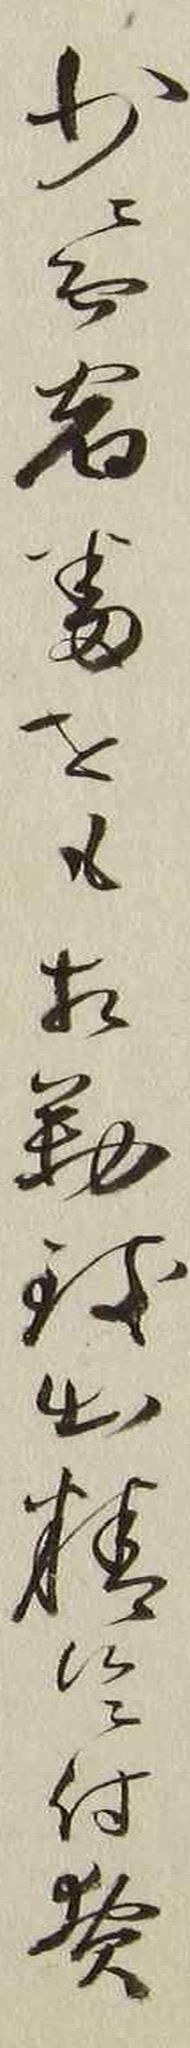少ニ而宿番をも相勤致出精候ニ付費
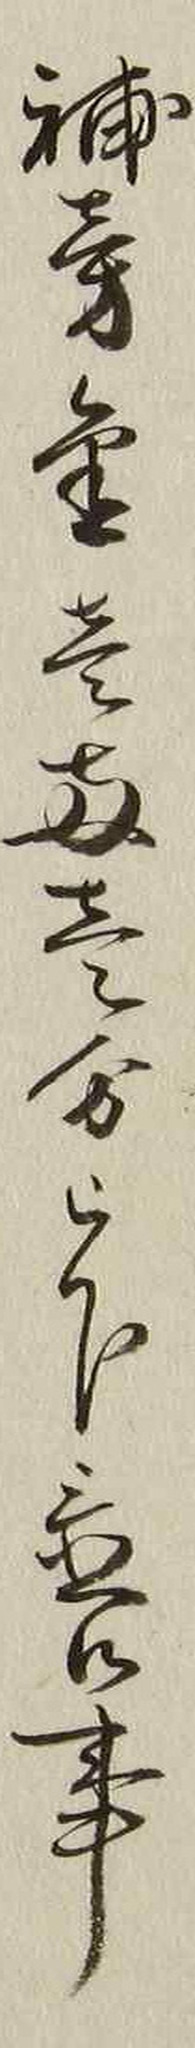補旁金壱両壱分被下置候事
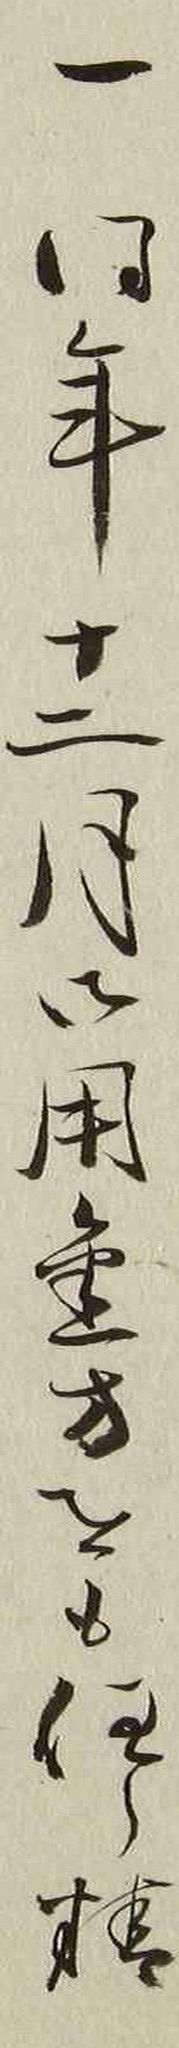一同年十二月御用金方をも任し精
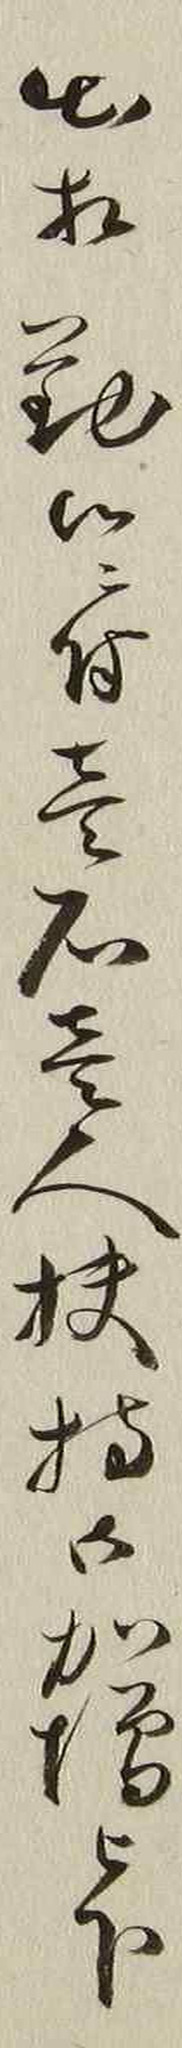出相勤候ニ付壱石壱人扶持御加増被下
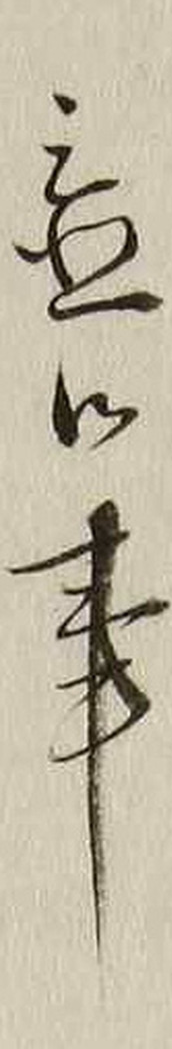置候事
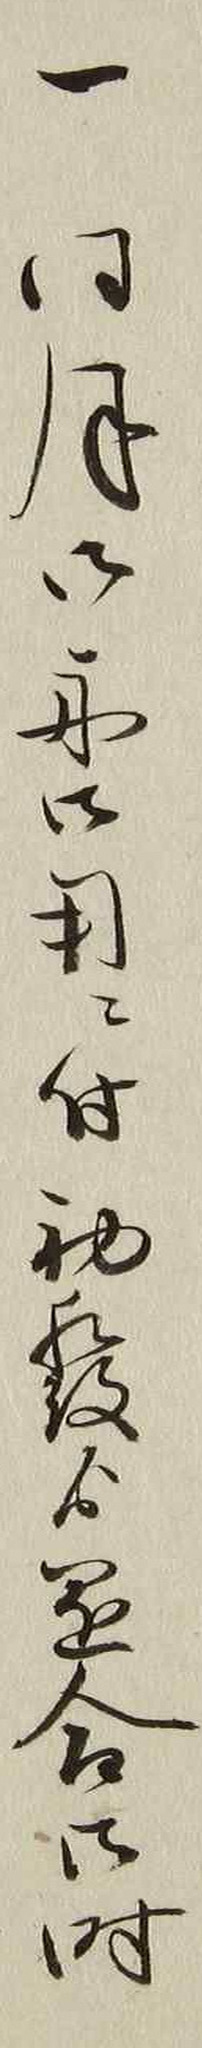一同月御舟御用ニ付初発ゟ懸合候時
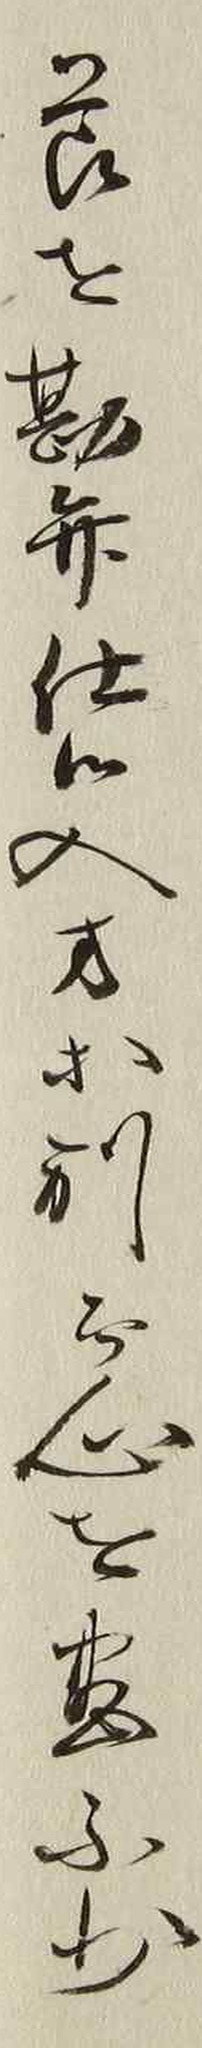節を勘弁仕候入方等別而心を尽不少
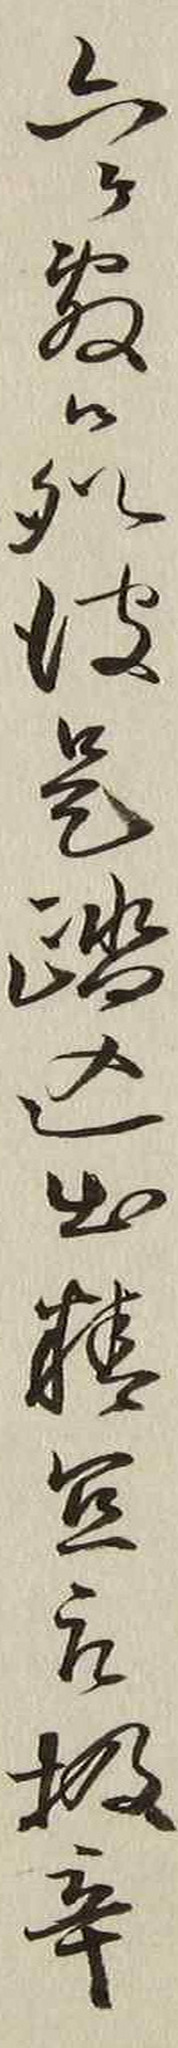六ヶ敷候処彼是踏込出精宜取扱辛
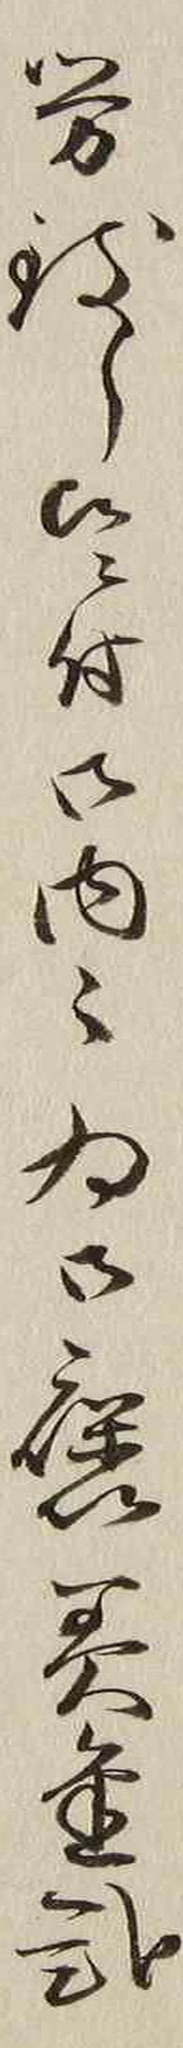労致し候ニ付御内々為御褒美金弐
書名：諸士系譜　巻之163　な之部5
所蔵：会津若松市立会津図書館
